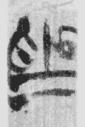爲
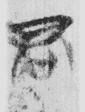君
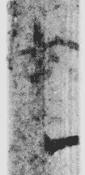才
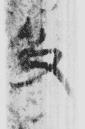及
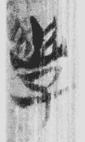{幽子}
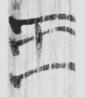王
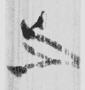之
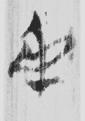身
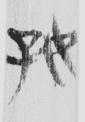好
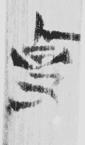史
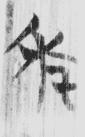年
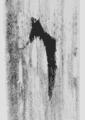人
